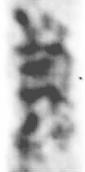○（陽）
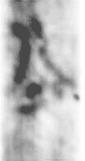公
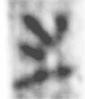之
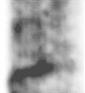一
